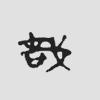哉
